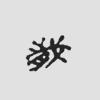歲
